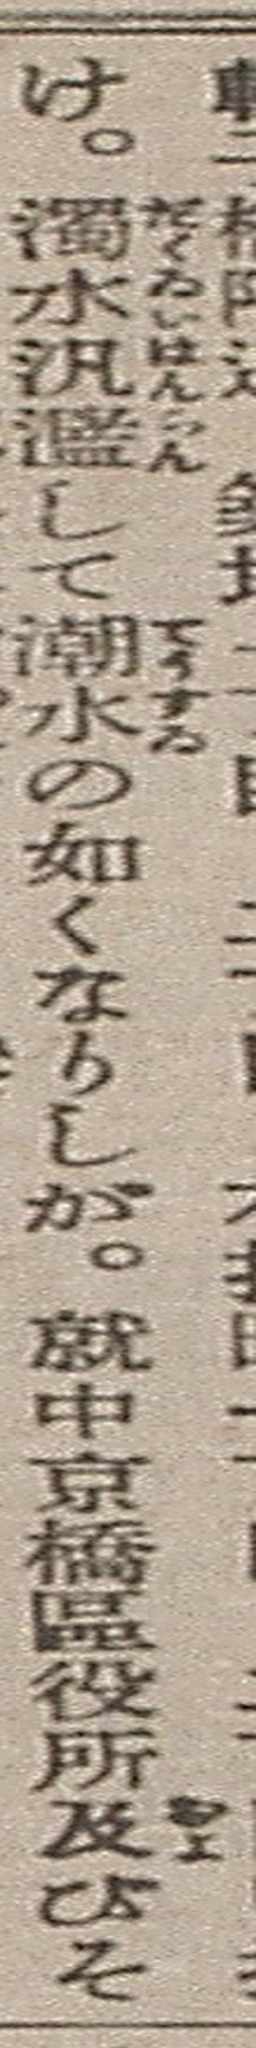け。濁水氾濫して潮水の如くなりしが。就中京橋区役所及びそ
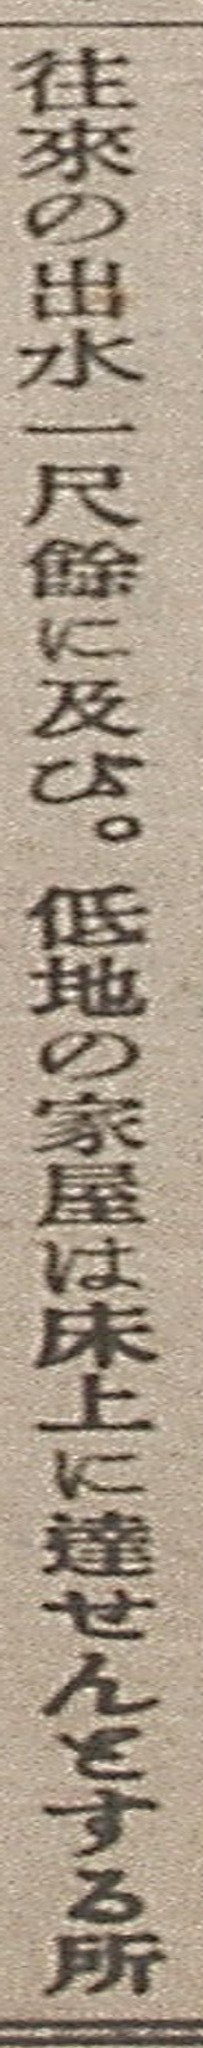往来の出水一尺余に及び。低地の家屋は床上に達せんとする所
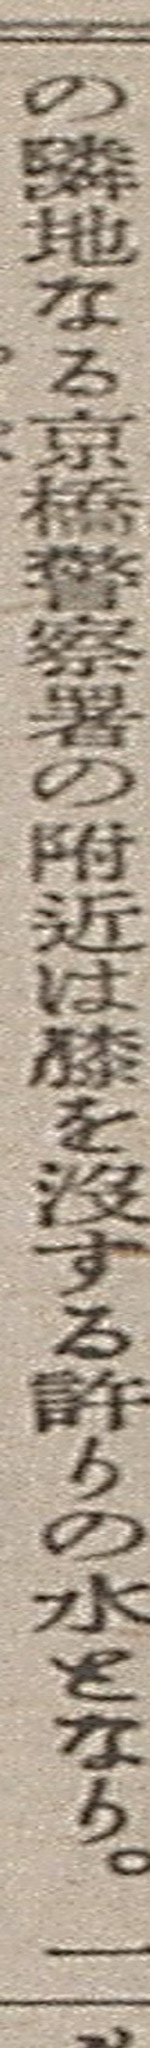の隣地なる京橋警察署の付近は膝を没する許りの水となり。一
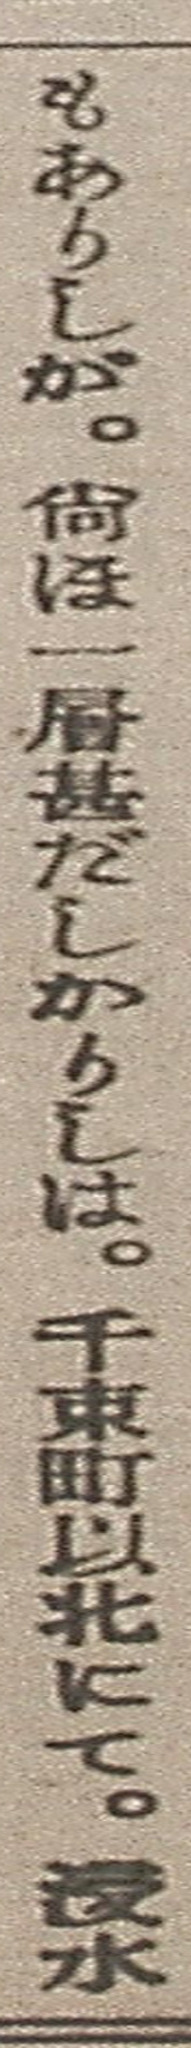もありしが。尚ほ一層甚だしかりしは。千束町以北にて。浸水
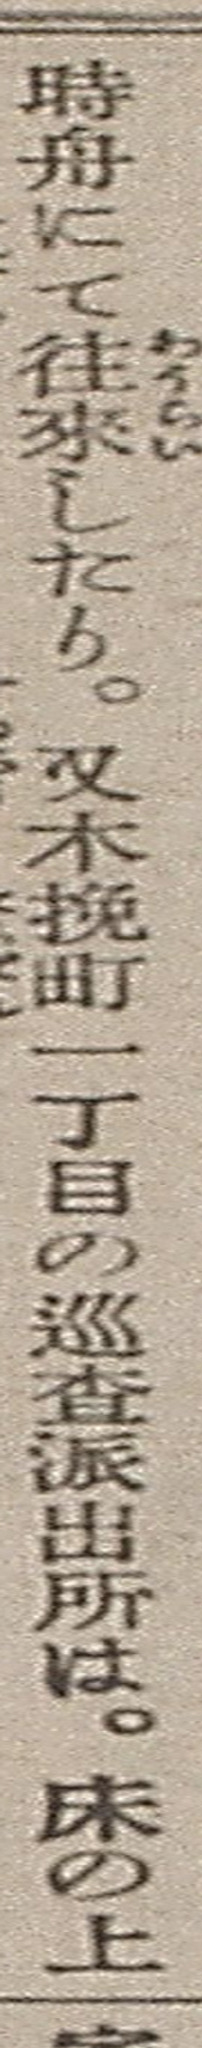時舟にて往来したり。又木挽町一丁目の巡査派出所は。床の上
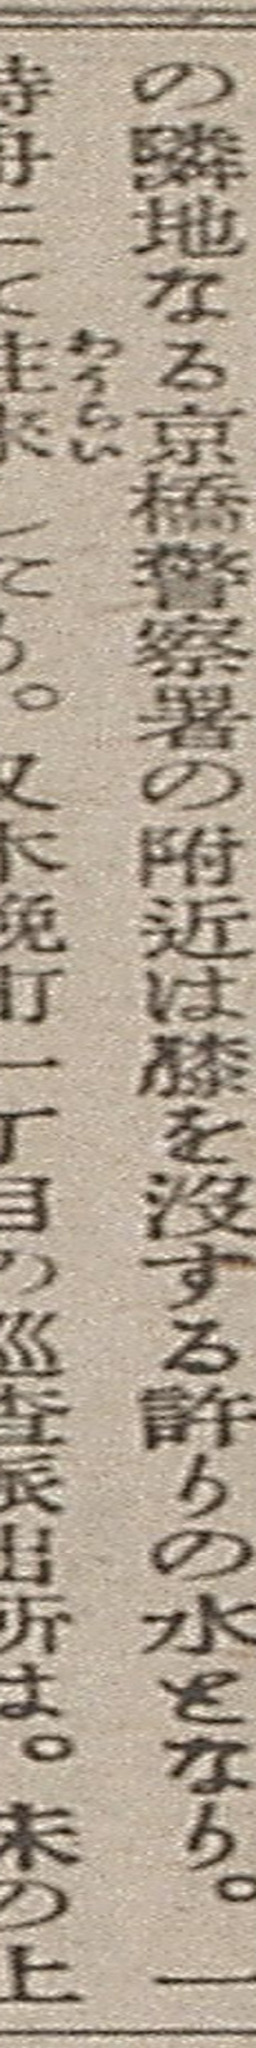時舟にて往来したり。又木挽町一丁目の巡査派出所は。床の上
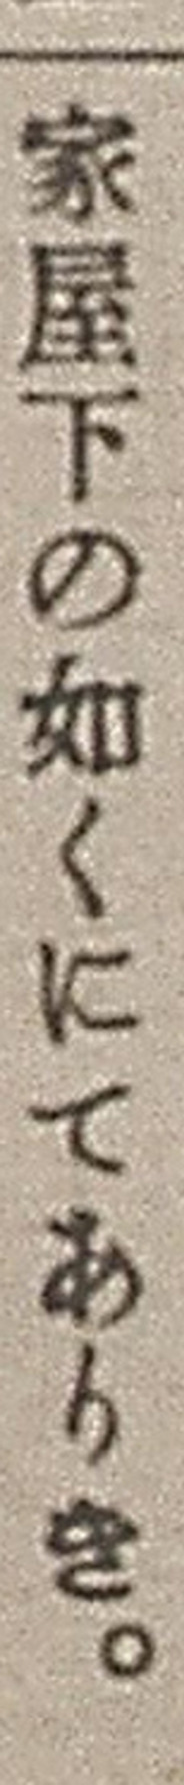家屋下の如くにてありき。
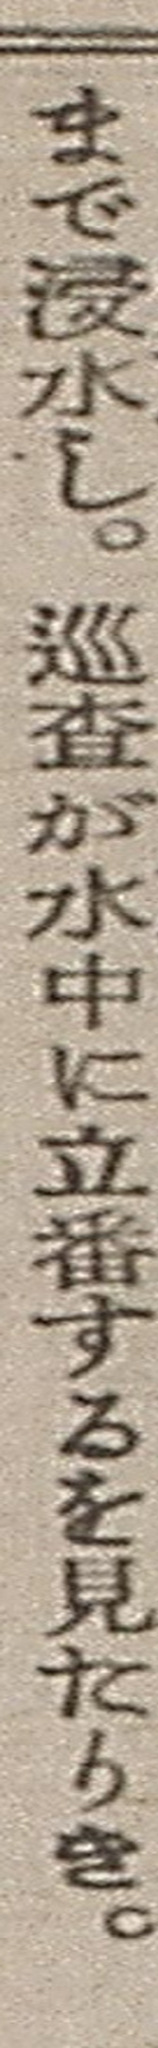まで浸水し。巡査が水中に立番するを見たりき。
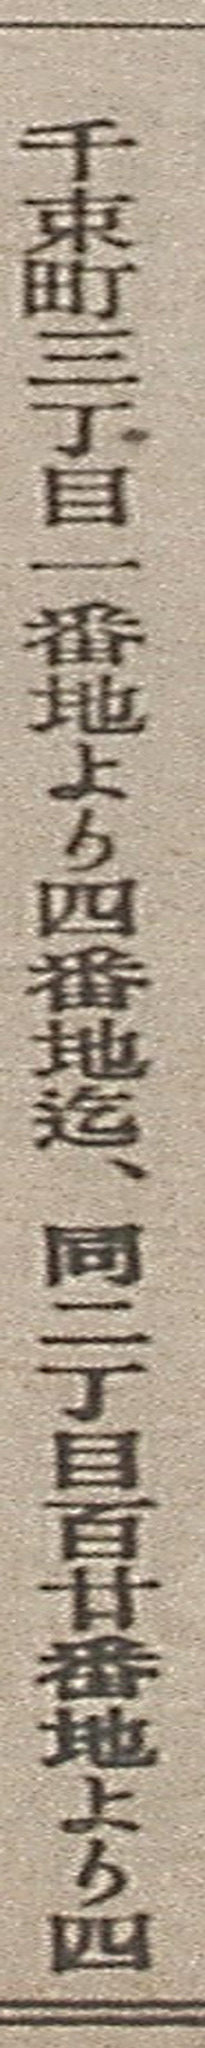千束町三丁目一番地より四番地迄、同二丁目百廿番地より四
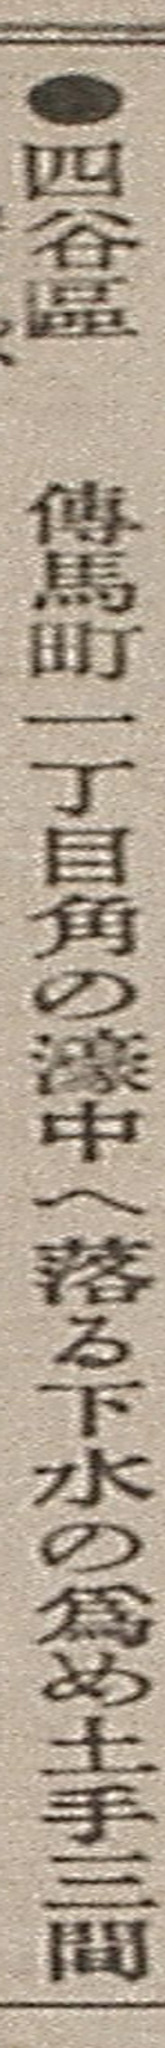●四谷区傳馬町一丁目角の濠中へ落る下水の為め土手三間
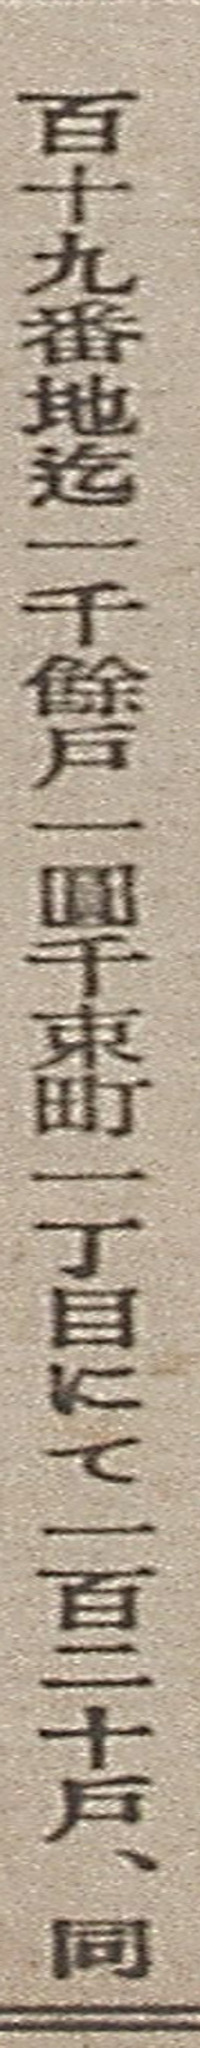百十九番地迄一千余戸一円千束町一丁目にて一珀二十戸、同
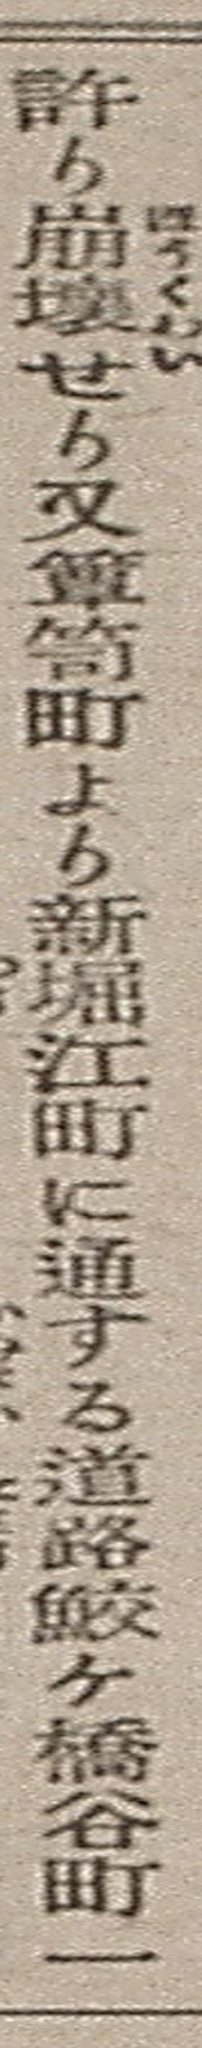許り崩壊せり又箪笥町より新堀江町に通する道路鮫ケ橋谷町一
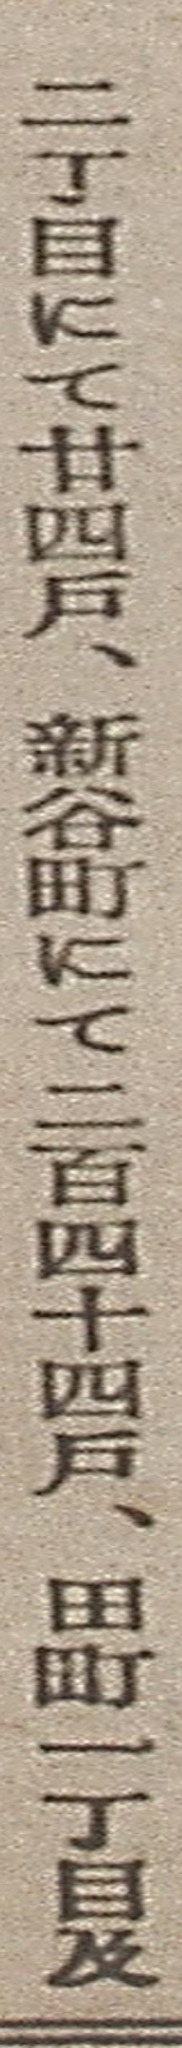二丁目にて廿四戸、新谷町にて二百四十四戸、田町一丁目及
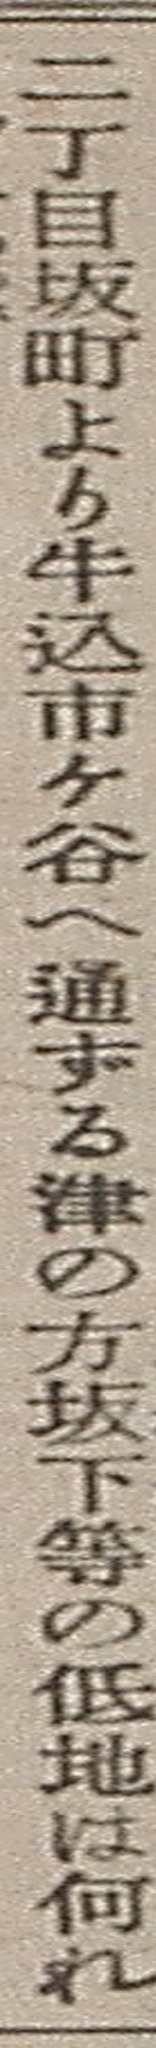二丁目坂町より牛込市ケ谷へ通ずる津の方坂下等の低地は何れ
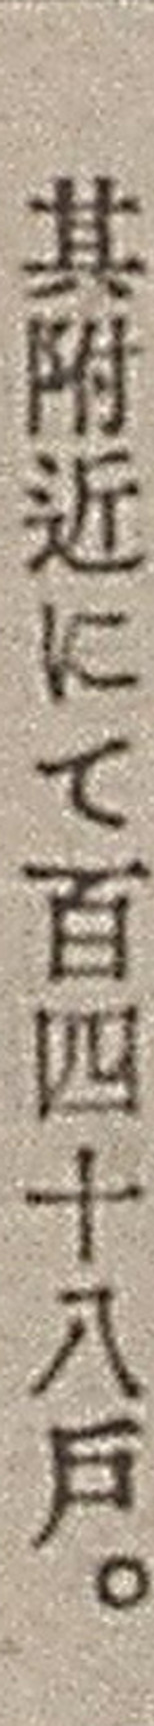其付近にて百四十八戸。
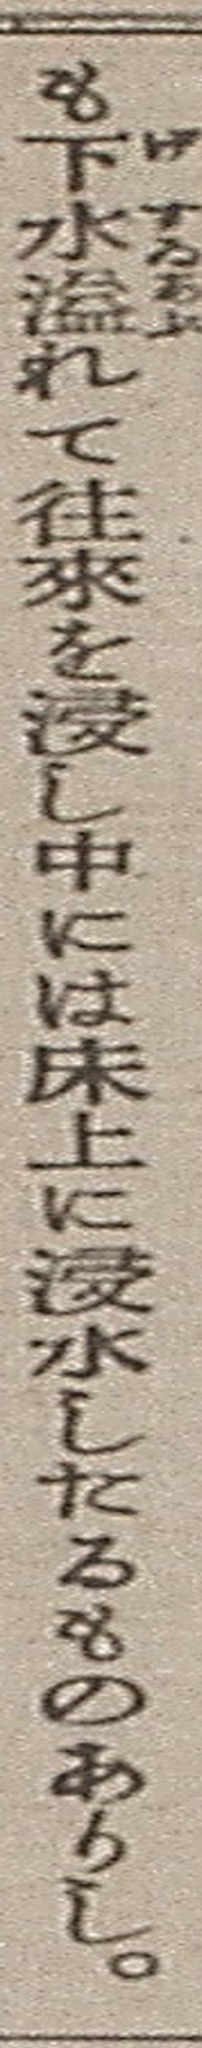も下水溢れて往来を浸し中には床上に浸水したるものありし。
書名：風俗畫報臨時増刊第百九十九號　明治三十二年十月各地災害圖會（前編之續）
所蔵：東京大学地震研究所図書室 Earthquake Research Institute Library, The University of Tokyo, JAPAN
